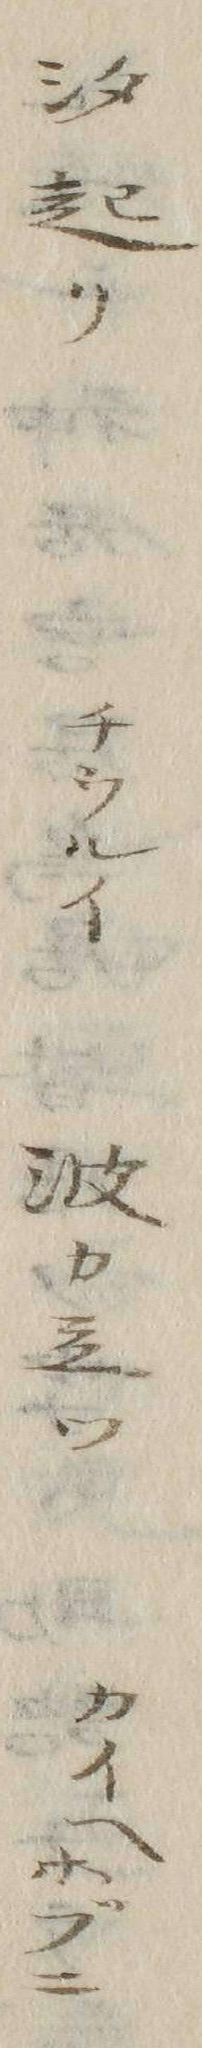汐起リチウルイ波カ立ツカイヘホブニ
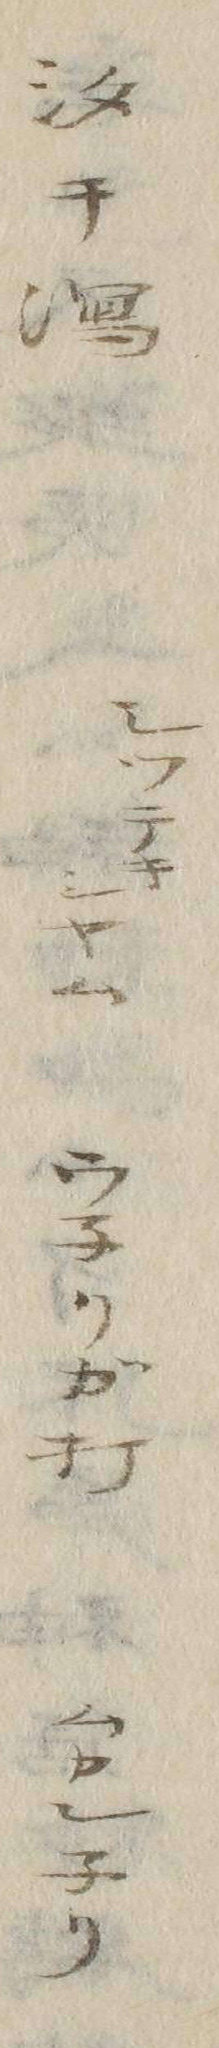汐干潟シツテキシヤムウネリガ打ムカレネリ
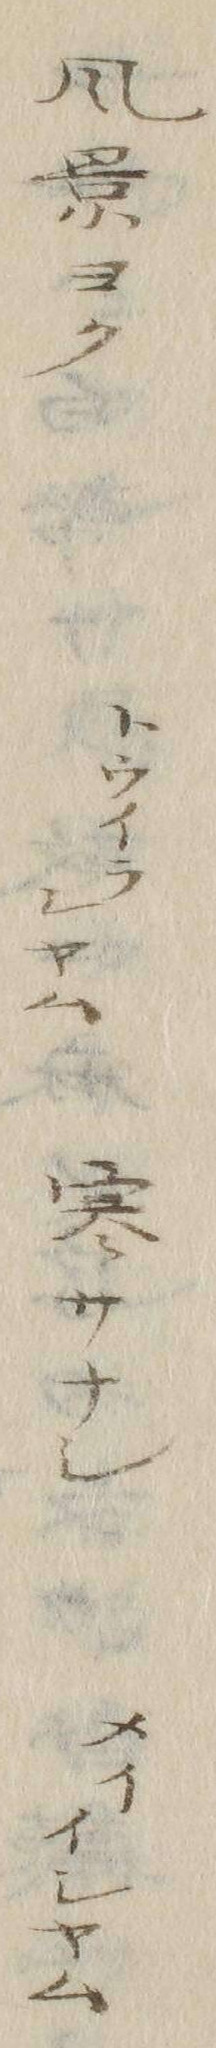風景ヨクトウイラシヤム寒サナシメイイシヤム
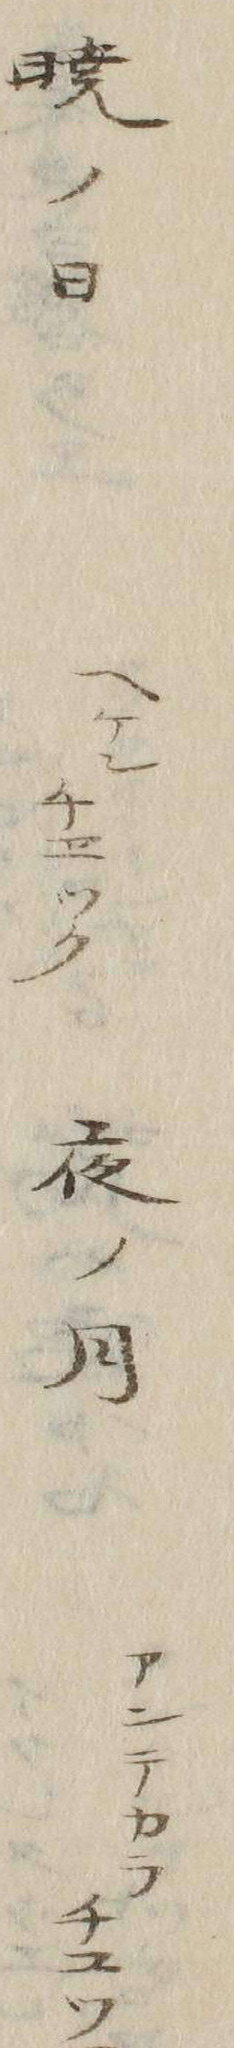暁ノ日ヘケレチヱツク夜ノ月アンチカラチユツフ
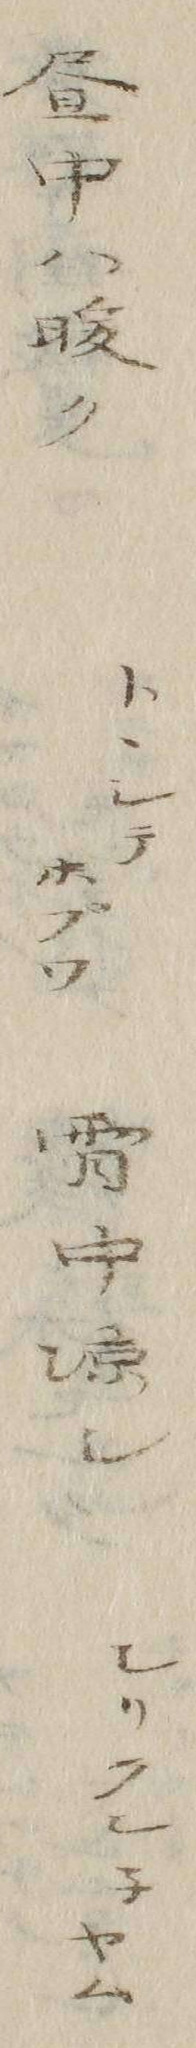昼中ハ暖クトヽシテホプワ宵中涼シシリクンネヤム
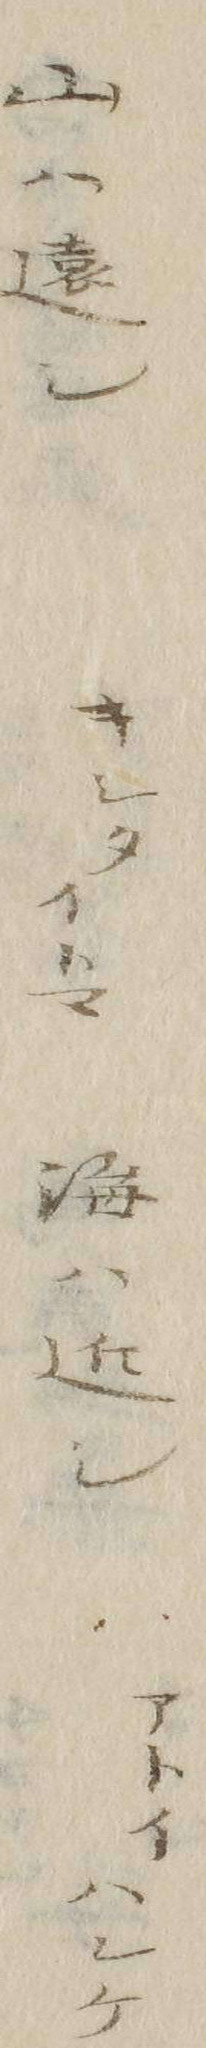山ハ遠シキンタイトマ海ハ近シアトイハンケ
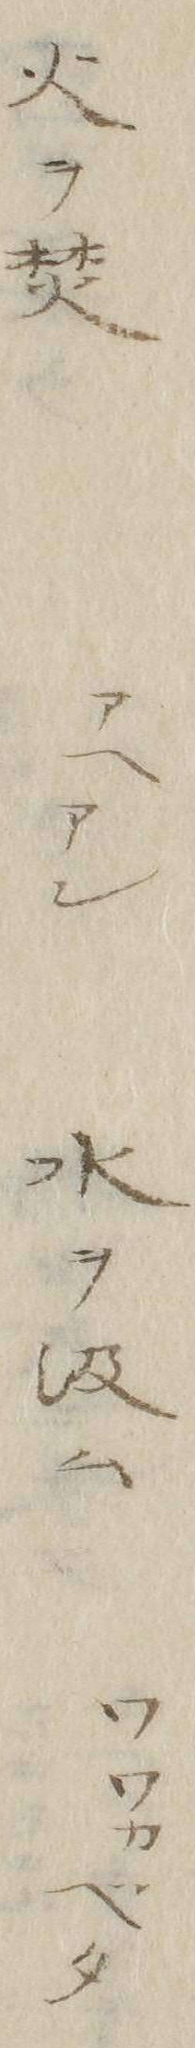火ヲ焚アヘアレ水ヲ汲ムワツカベタ
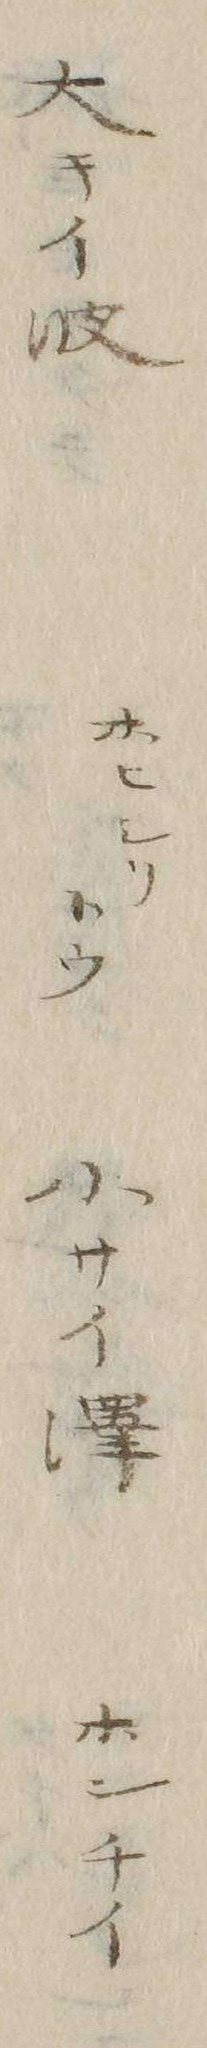大キイ波ホヒシリトウ小さい沢ホンチイ
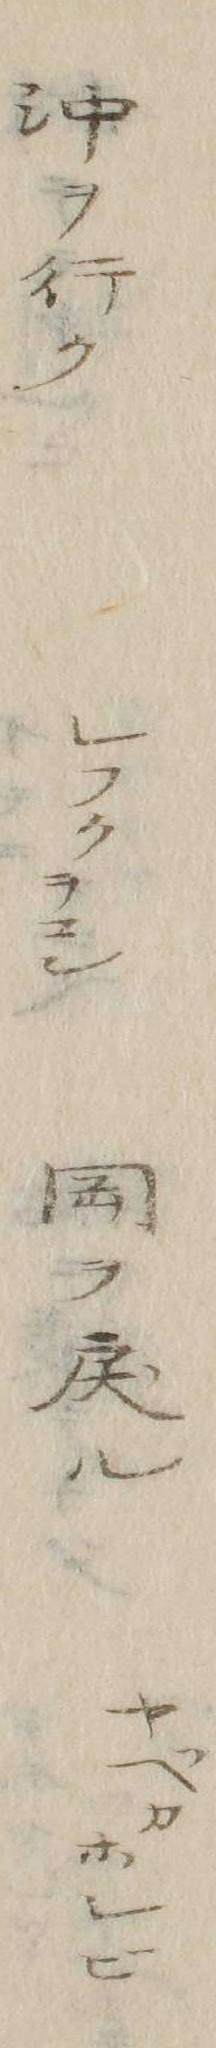沖ヲ行クレフウヲマン岡ヲ戻ルヤベカホシビ
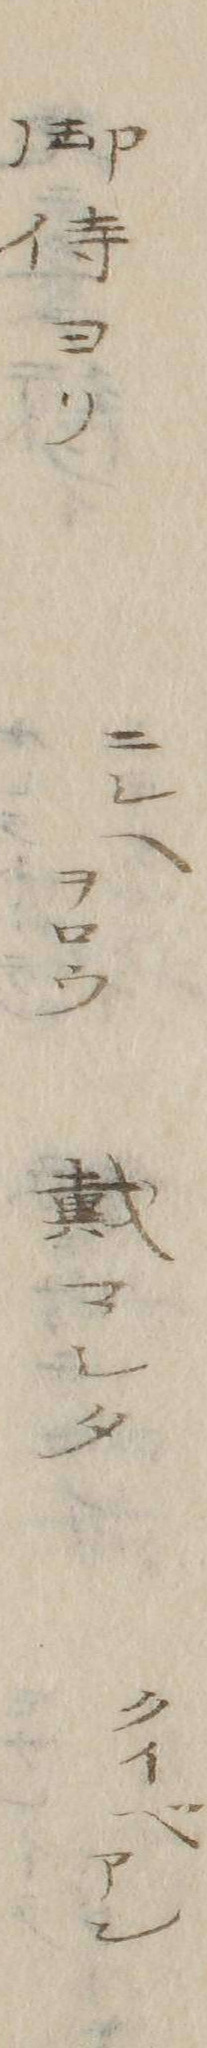御侍ヨリニシヘヲロウ戴マシタクイベアン

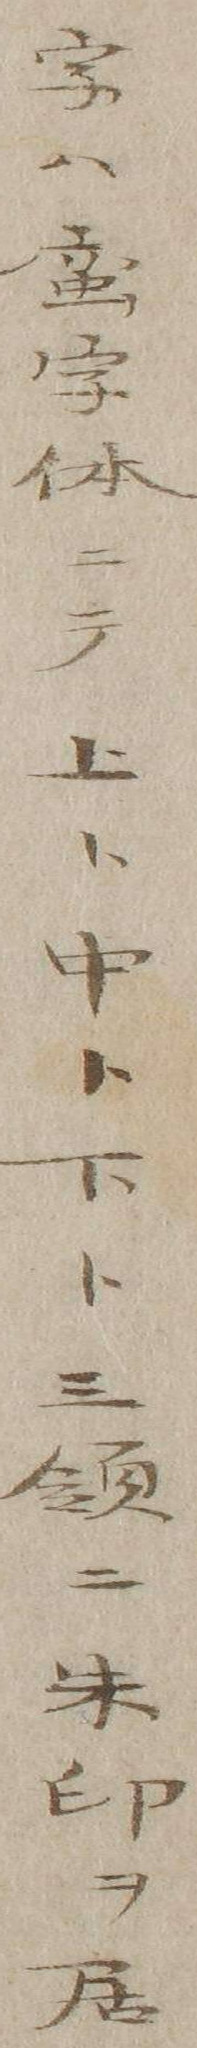字ハ蛮字体ニテ上ト中ト下ト三領ニ朱印ヲ居
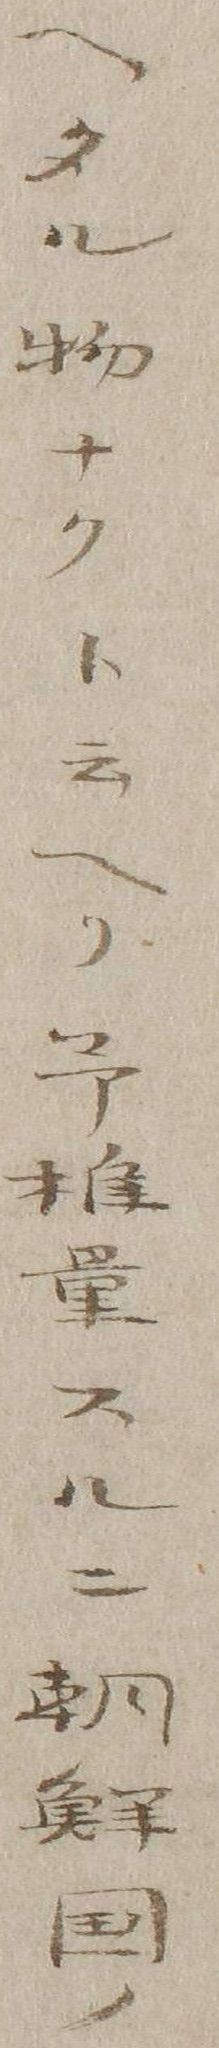ヘタル物ナリト云ヘリ予推量スルニ朝鮮国ノ
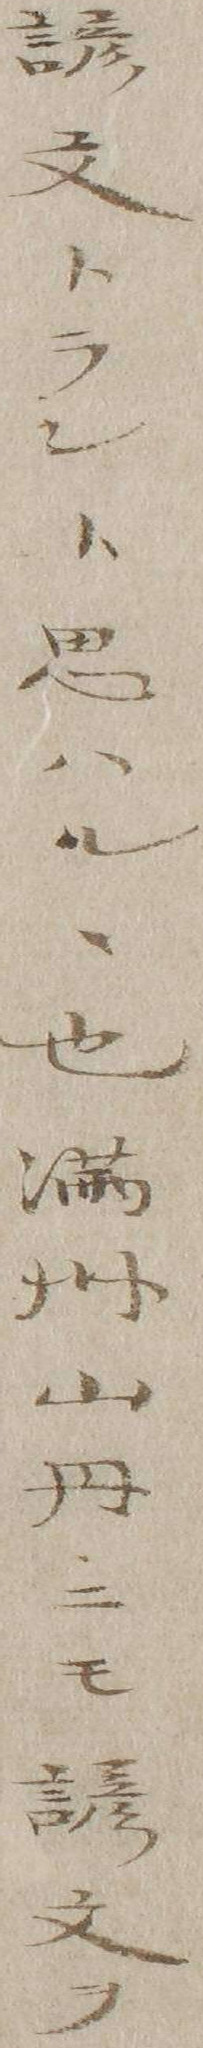諺文トラント思ハルヽ也満州山丹ニモ諺文ヲ
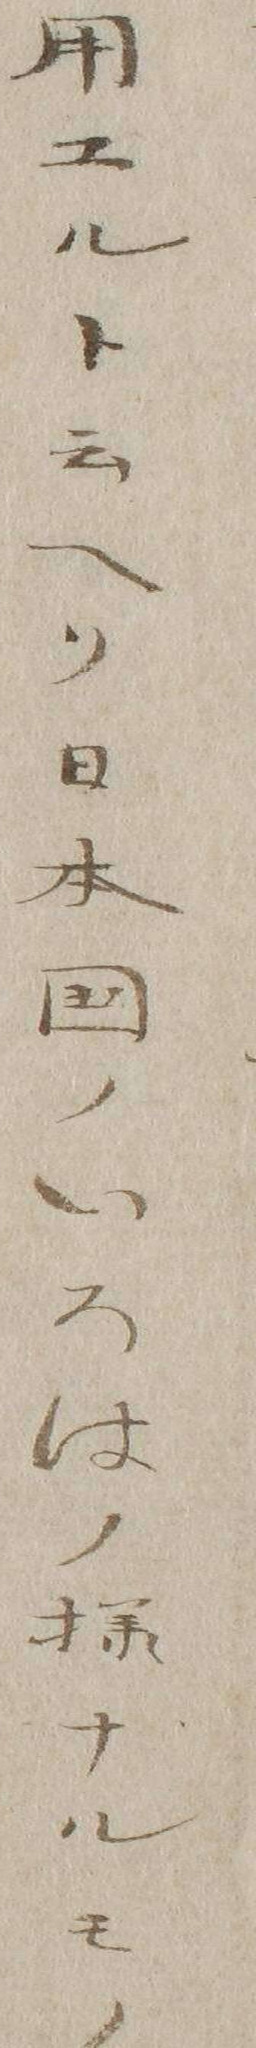用ユルト云ヘリ日本国ノいろはノ様ナルモノ
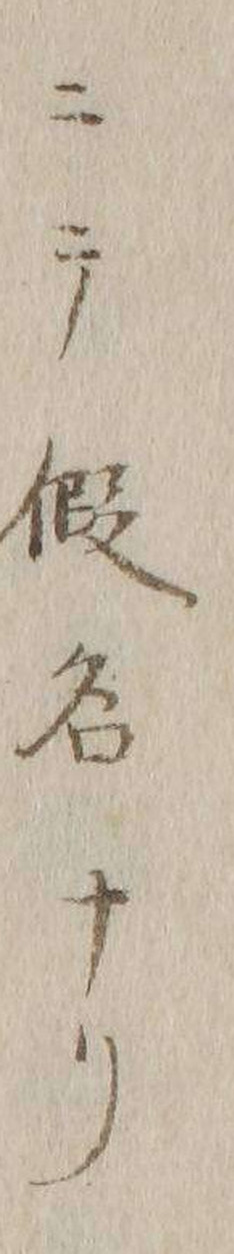ニテ仮名ナリ
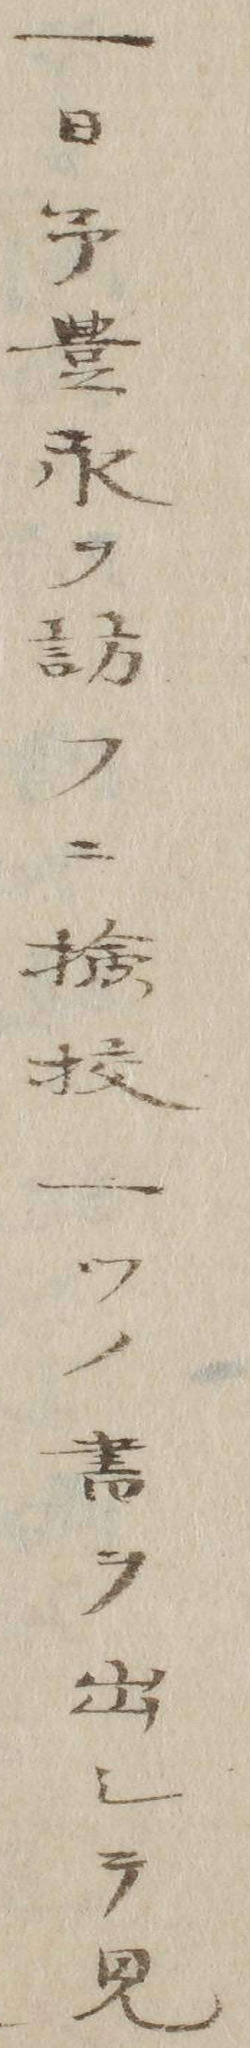一日予豊永ヲ訪フニ撿校一ツノ書ヲ出シテ見
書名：蝦夷草紙（国文学研究資料館）
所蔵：国文学研究資料館
